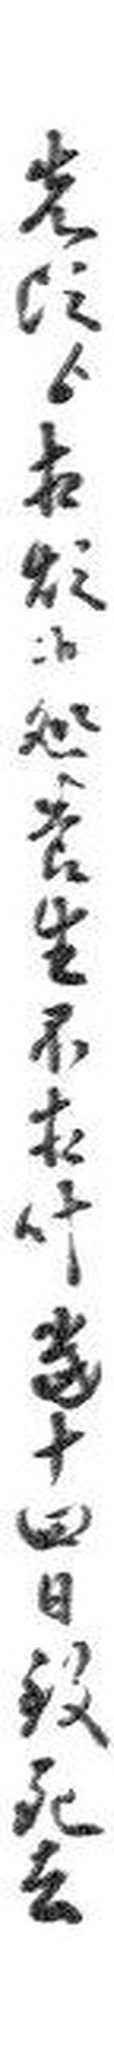先頃ゟ相煩候処養生不相叶当十四日致死去
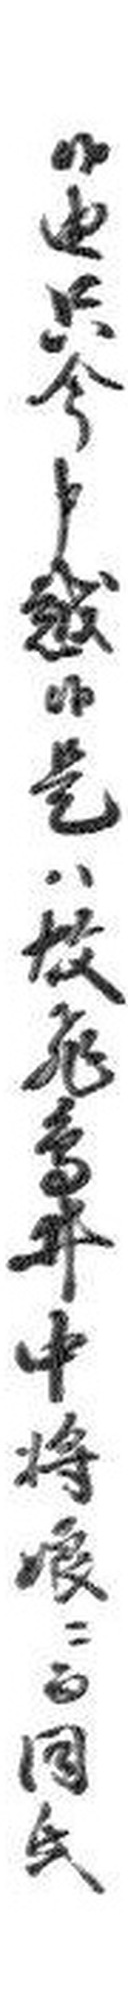候由只今申越候是ハ故飛鳥井中将娘ニ而同氏
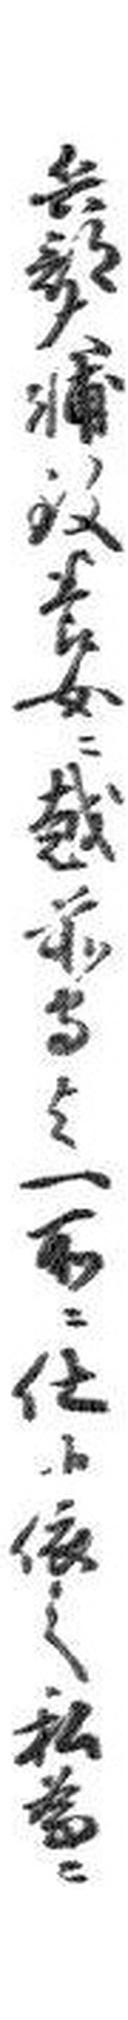兵部大輔致養女ニ越前守与一所ニ仕候依之私為ニ
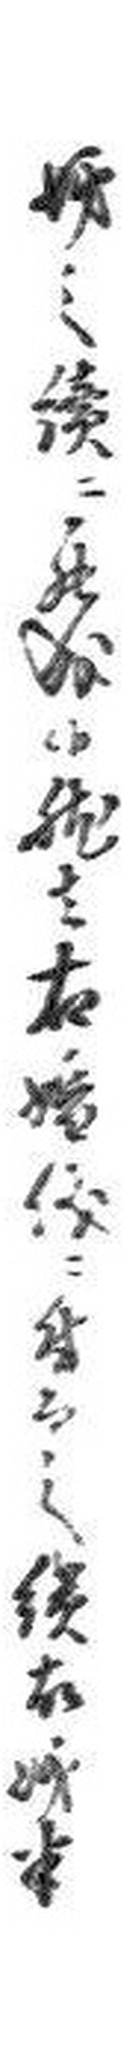姉之続ニ罷成候然者右婚儀ニ付而之続故姉半
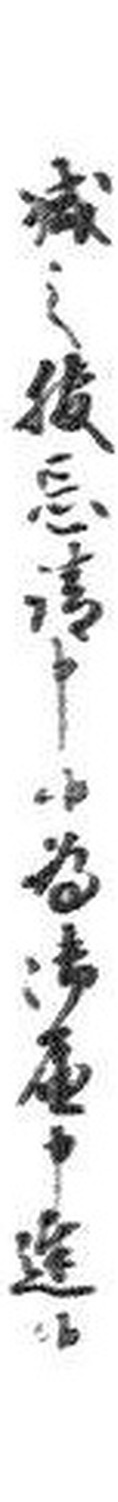減之服忌請申候為御届申達候
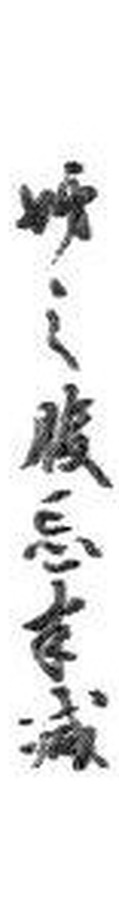姉之服忌半減
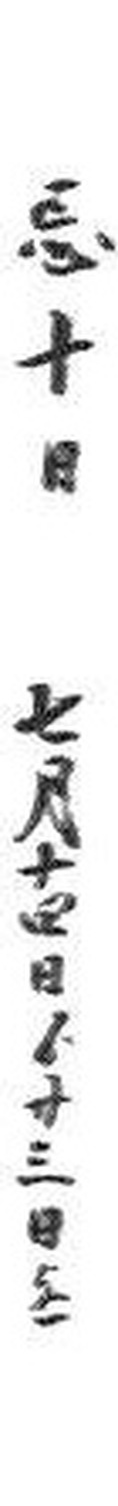忌十日七月十四日ゟ廿三日迄
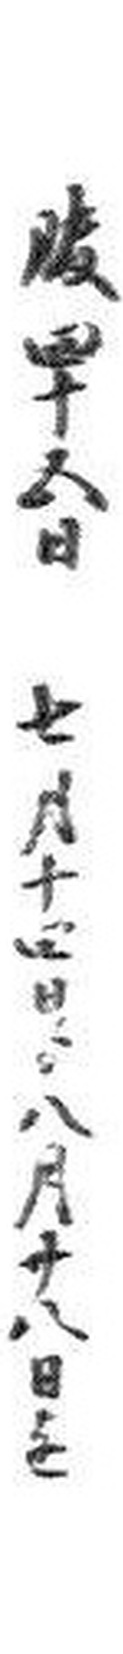服四十五日七月十四日ゟ八月廿八日迄

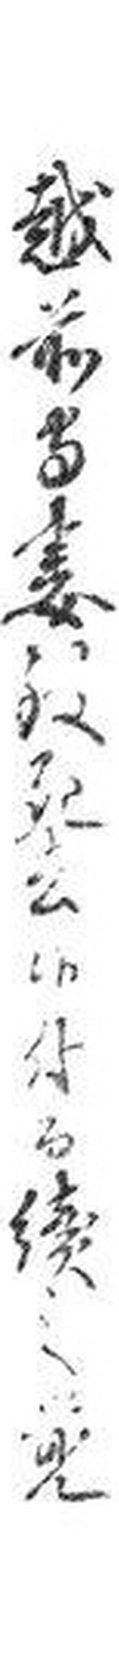越前守妻致死去候付而続之覚
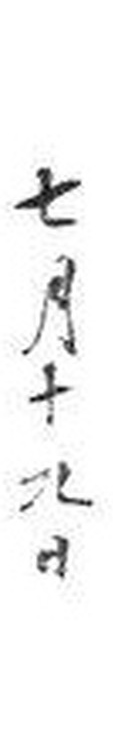七月十九日
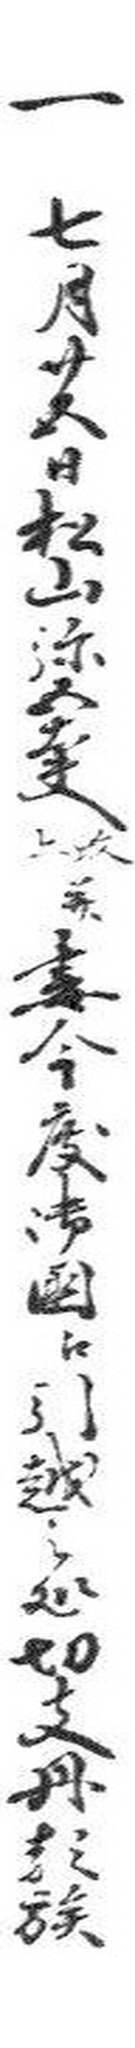一七月廿五日松山弥五太夫并妻今度御国江引越之処切支丹類
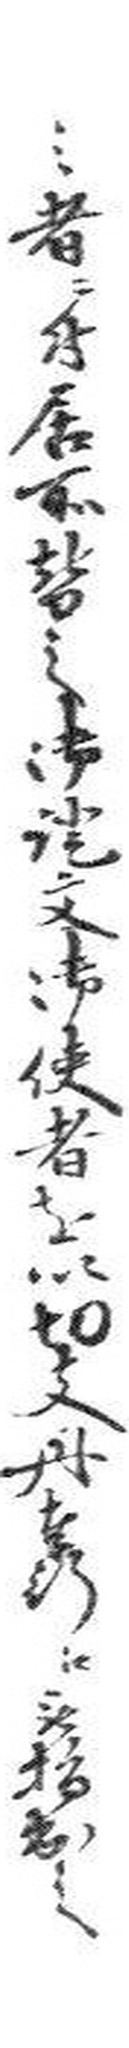之者ニ付居処替之御証文御使者を以切支丹奉行江被指出之
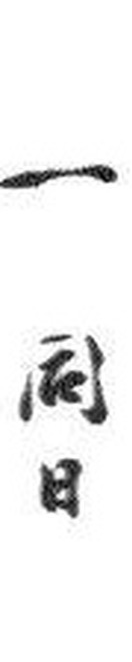一同日
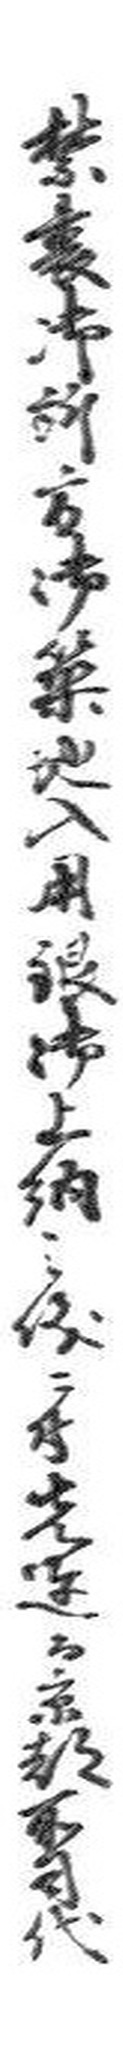禁裏御所方御築地入用銀御上納之儀ニ付先達而京都所司代
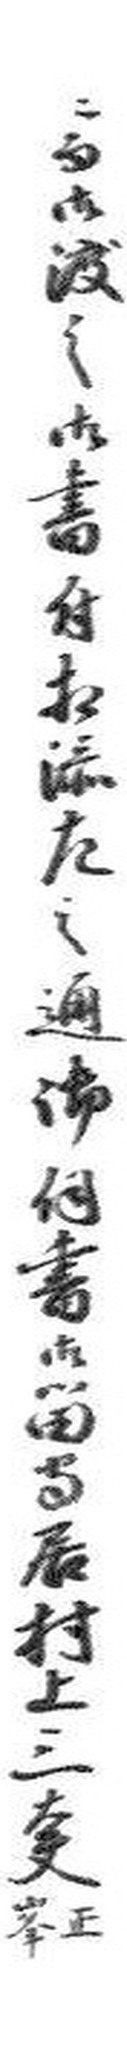ニ而御渡之御書付相添左之通御伺書御留守居村上三太夫正峯
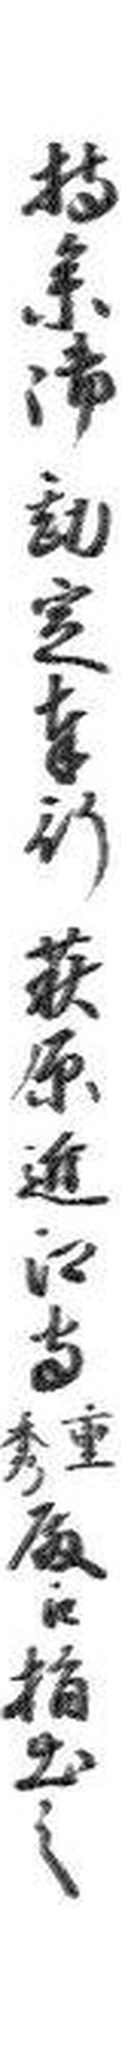持参御勘定奉行萩原近江守重秀殿江指出之
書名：家譜 二十九 吉邦公 従正徳二年到正徳三年
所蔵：福井県文書館 Fukui Prefectural Archives
